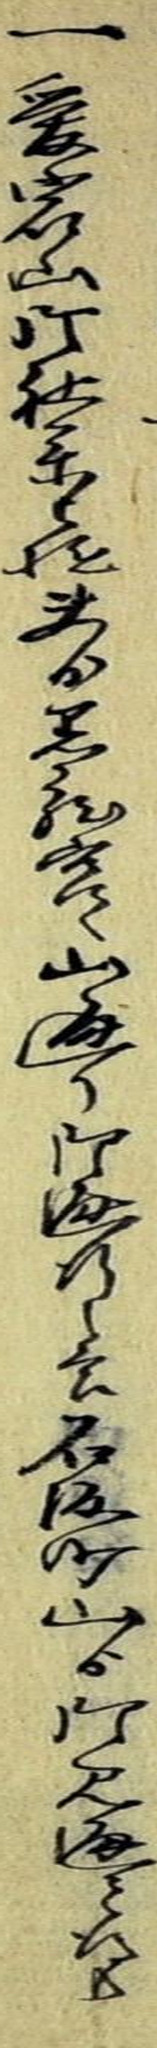一愛宕山御社参被遊夫ゟ黒龍宮へ山通リ御通行之節石坂町山ゟ御見通ニ候得共
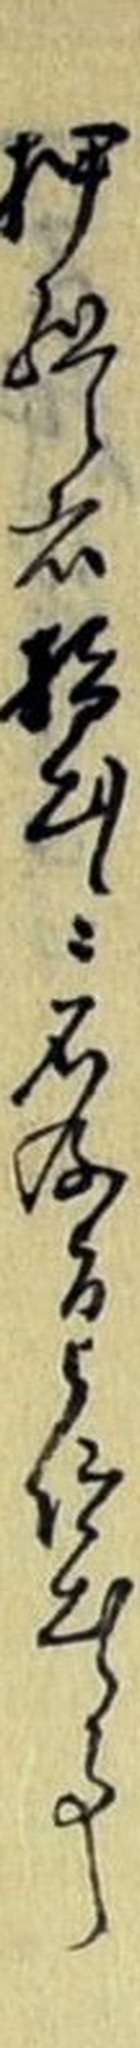押組之者指出候ニ不及旨被仰出候事
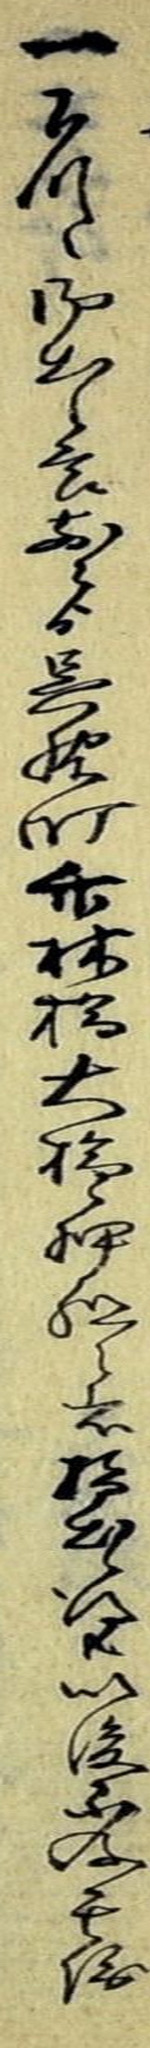一下川へ御出候節前々ゟ呉服町竹林橋大橋へ押組之者指出候得共以後不及其儀
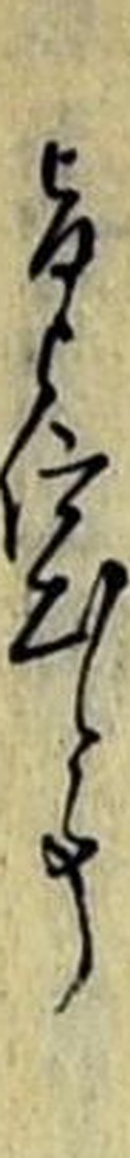旨被仰出候事
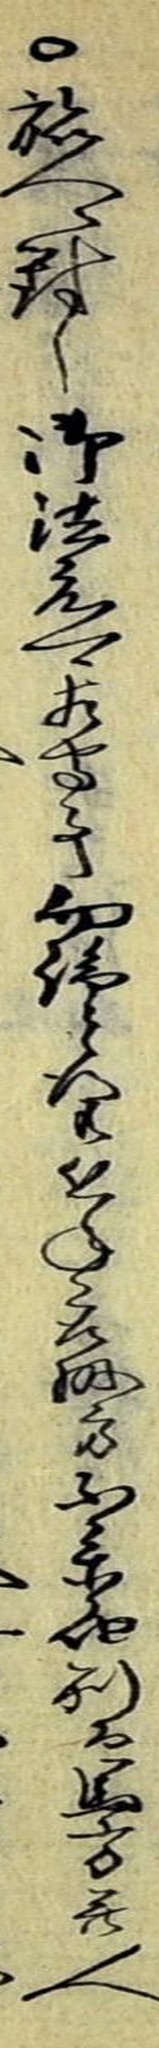〇旅人へ対し御法度可相守事勿論ニ候得共近年取扱方不参届別而馬方并人
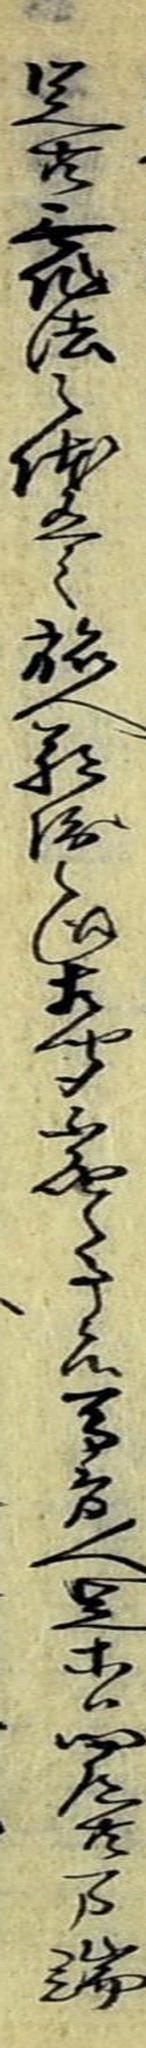足共無作法之体有之旅人難儀之趣相聞不届之事ニ候馬方人足等ハ問屋共
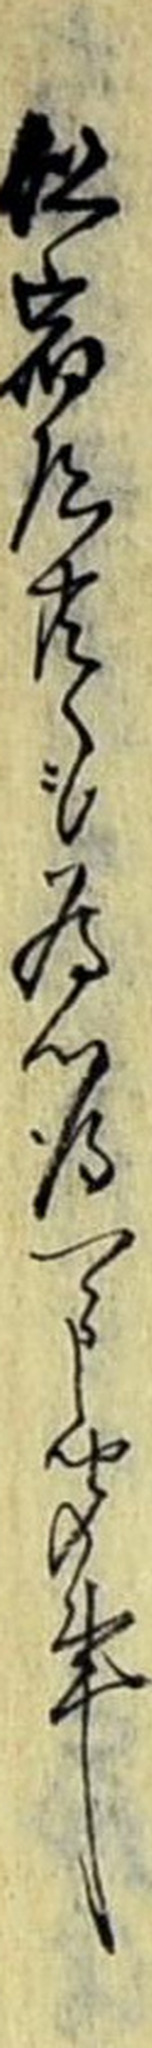但宿屋共へも為心得可申聞事
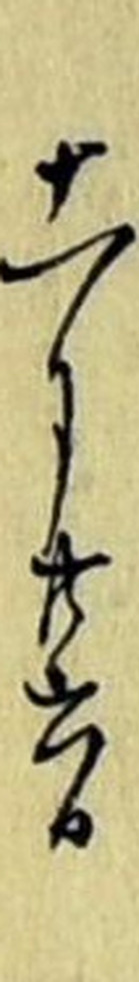十一月廿六日

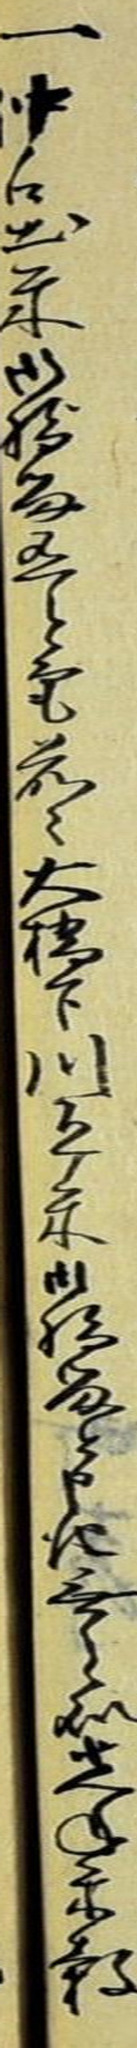一沖ノ口出米御指留有之と而も前々大橋下川下ケ米御指留と申儀無之処先年米穀

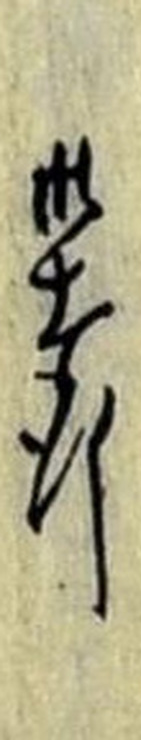御奉行
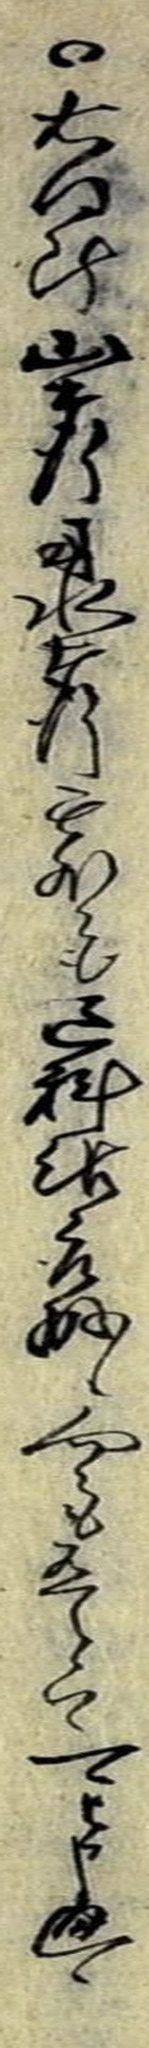〇右同断山奉行用水奉行其外とも過料銀取扱候向々も有之候ハヽ可被申通候
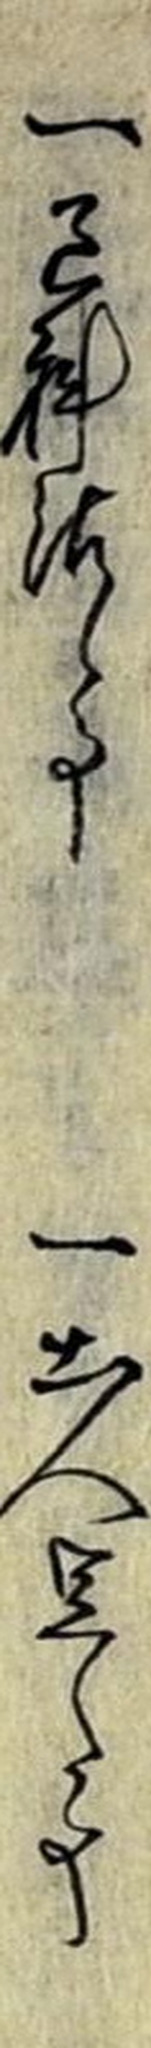一過料銀之事一出人足之事
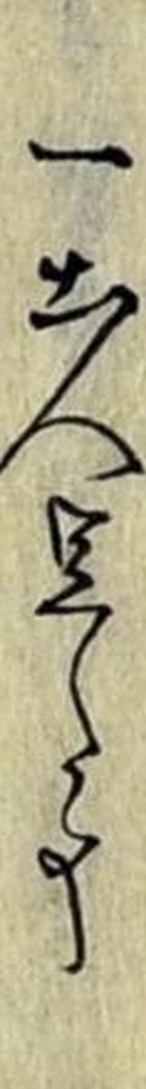一出人足之事
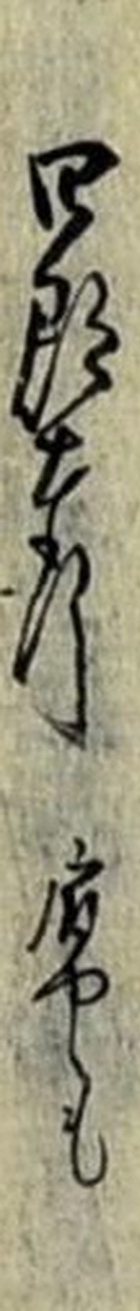四郡奉行府中へも
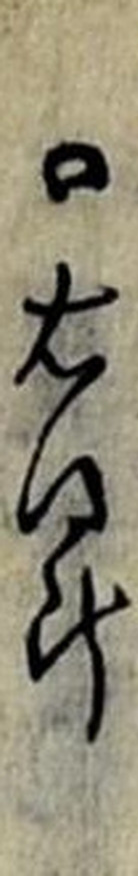〇右同断
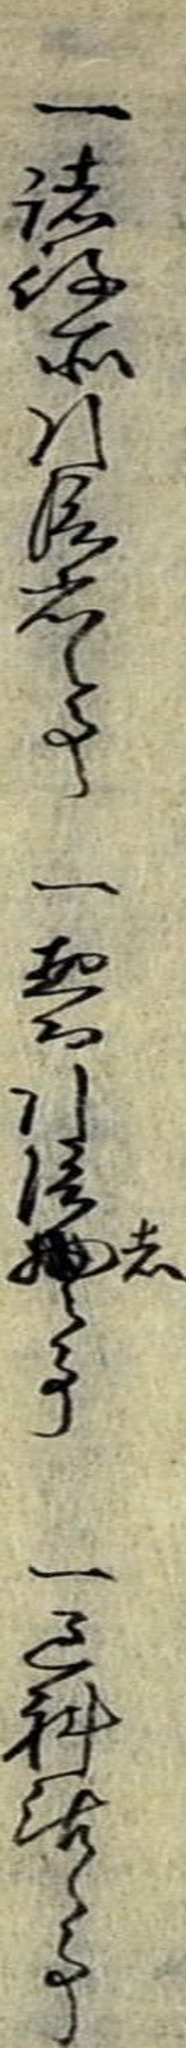一諸役所引渡者之事一惣而引渡者之事一過料銀之事
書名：命令之部 三
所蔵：福井県文書館 Fukui Prefectural Archives
